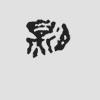則
